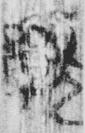獸（守）
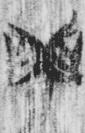門
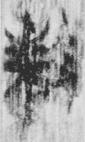○（侏）
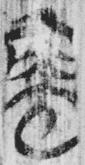需（儒）
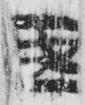爲
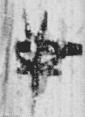矢
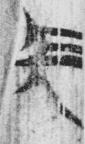長
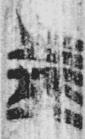者
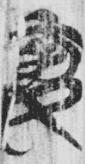婁（僂）
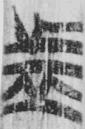者
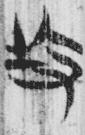○（仕）
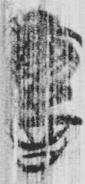○（數）
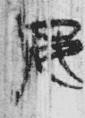○（癭）
